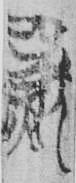獸
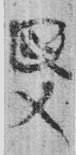○（得）
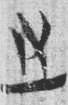之
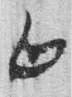㠯（以）
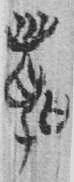○〈鳴〉
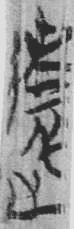遠
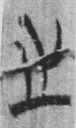之
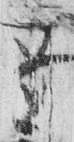步
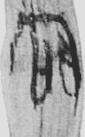含（禽）
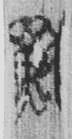獸
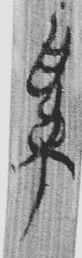○（奚）
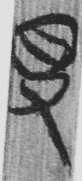○（得）
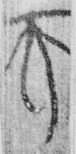而
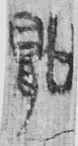鳴
